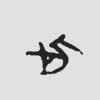必
